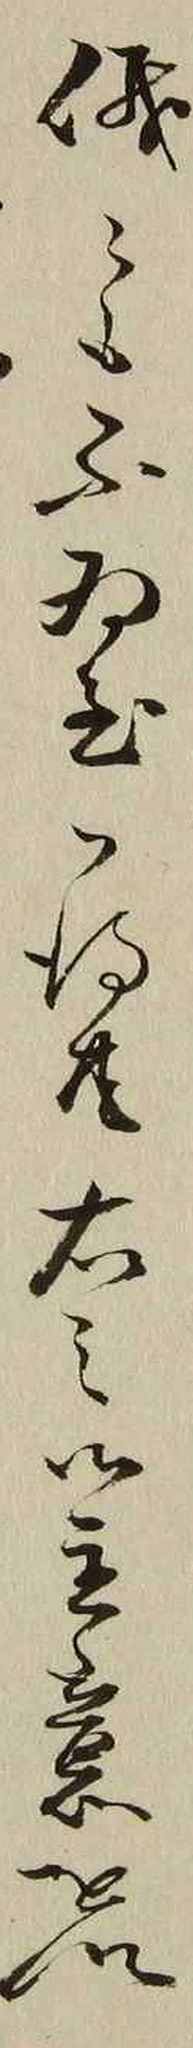儀にも不為至候得共右之御主意を以
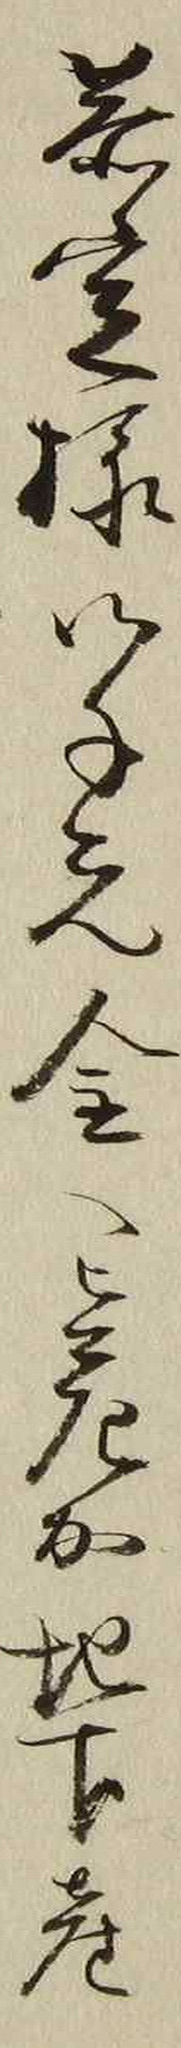恭定様御手元金へ差加地下産
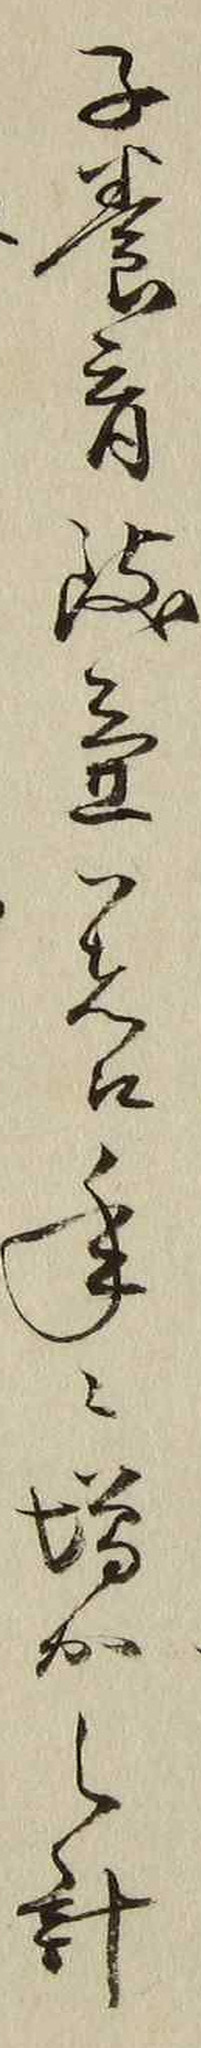子養育致宜候者江年々増加之計
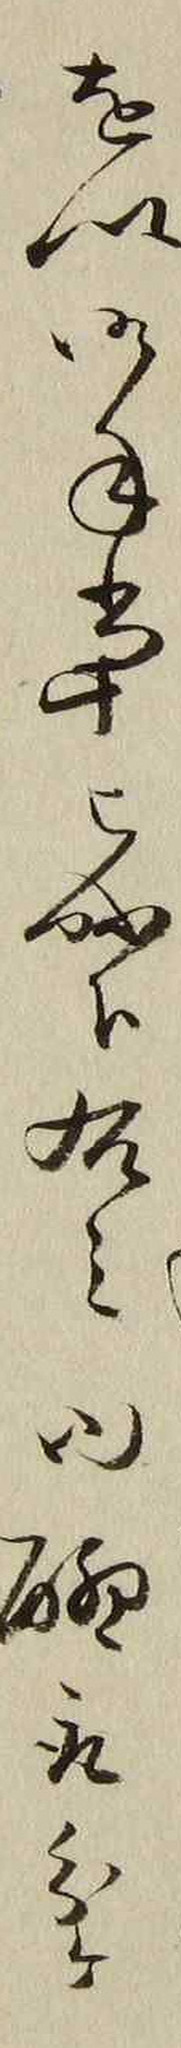を以御手当被成下右之内聊取分け
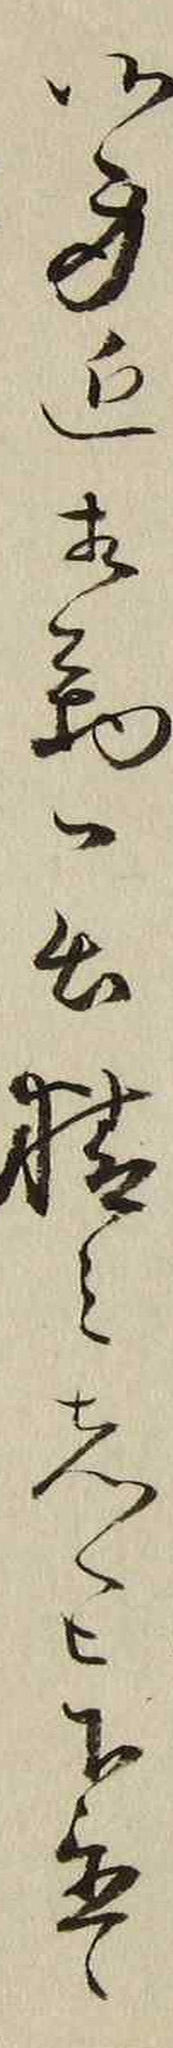御身近相勤候出精之者へ被下置候
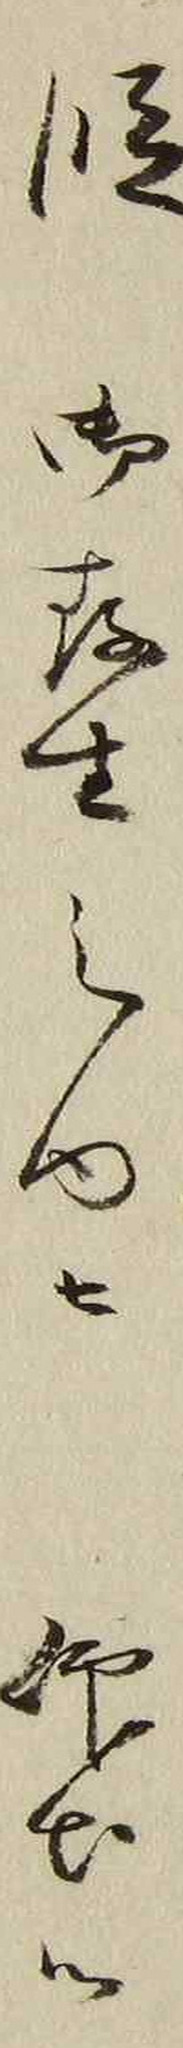段御存生之内被仰出候
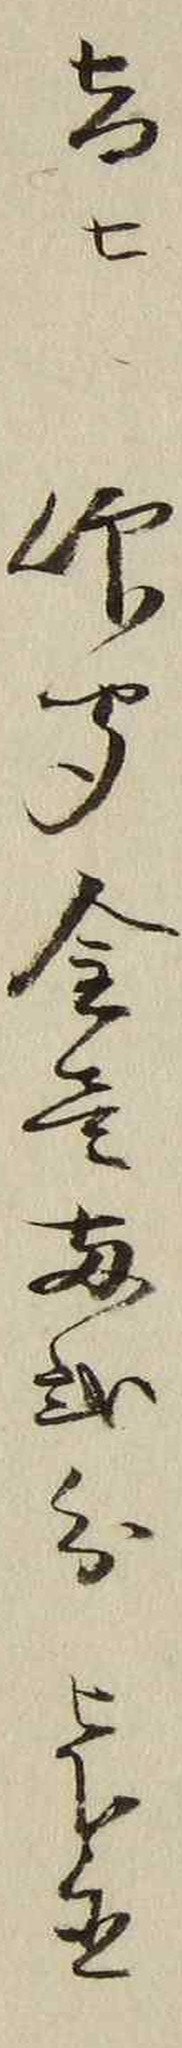旨被仰聞金壱両弐分被下置
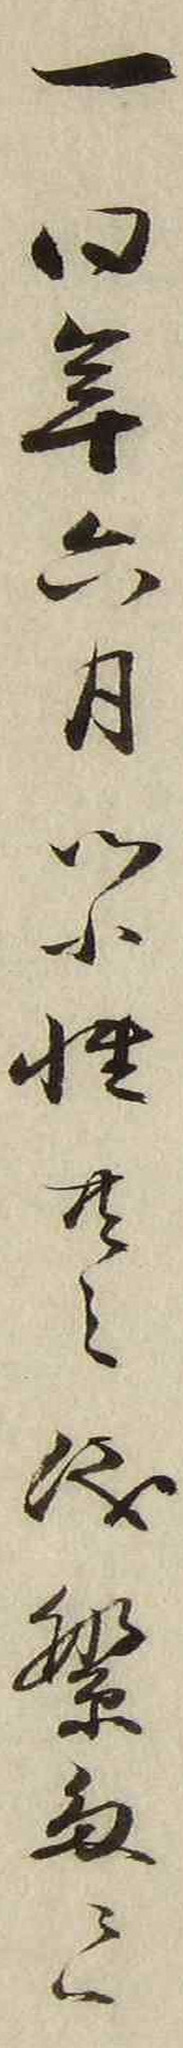一同年六月御小姓共之儀繁多には

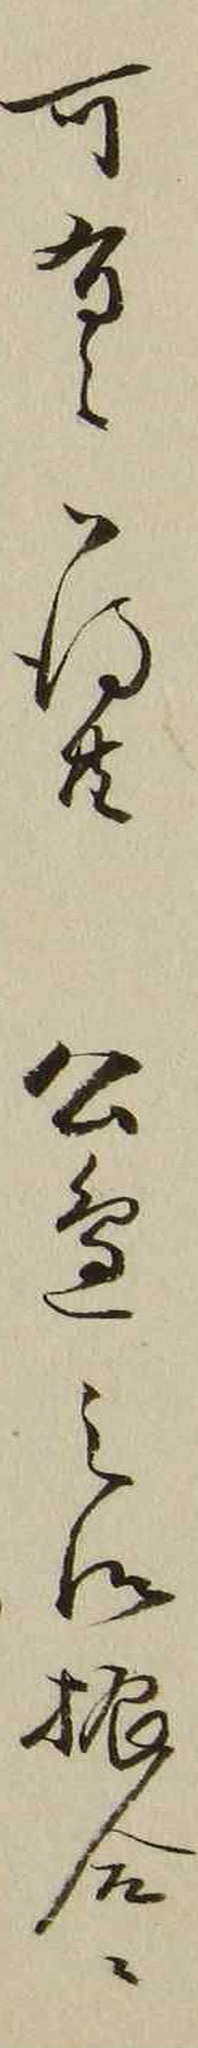可有之候得共公辺之御振合に
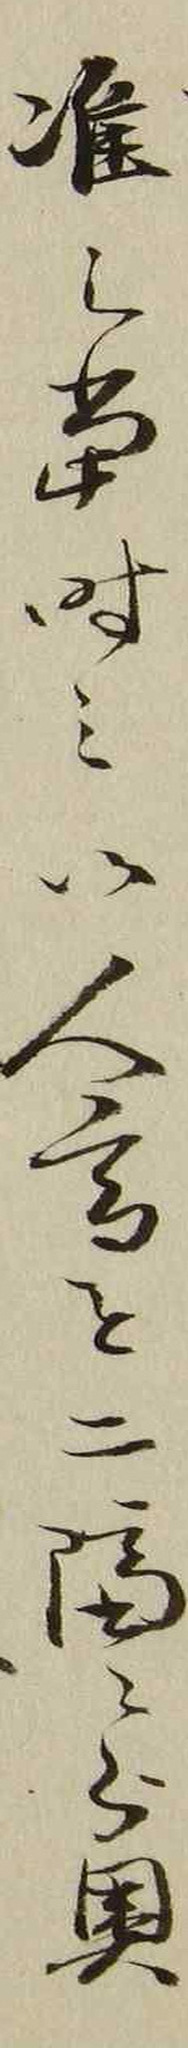准し当時之御人高を二隔に分奥
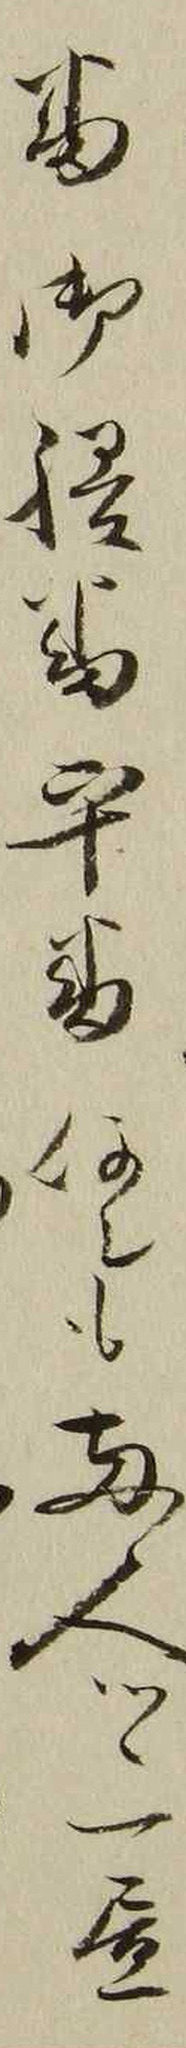番御膳番平番何れも両人ツゝ一昼
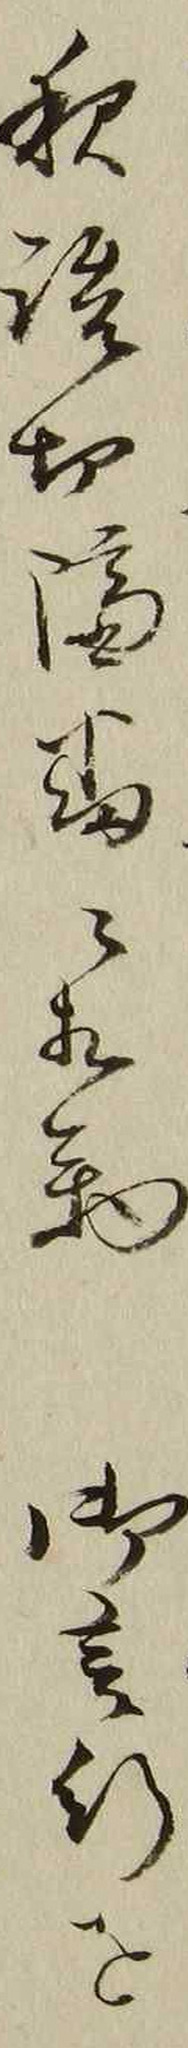夜詰切隔番に相勤御言行を
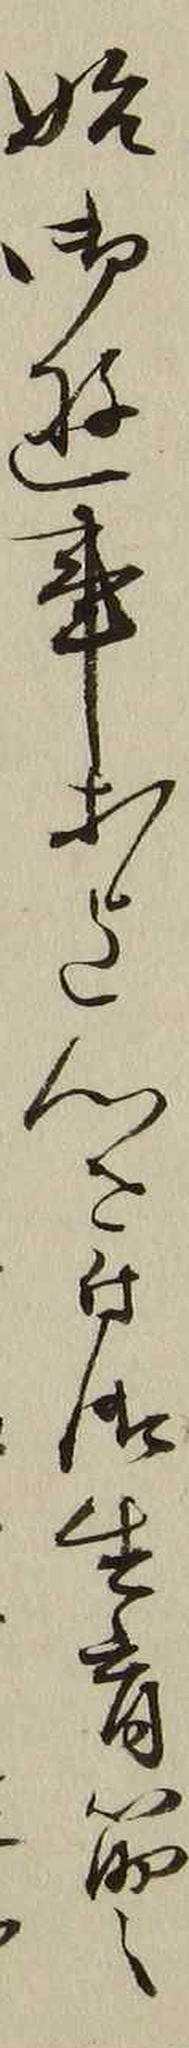始御遊事等迄心を付御生育筋之
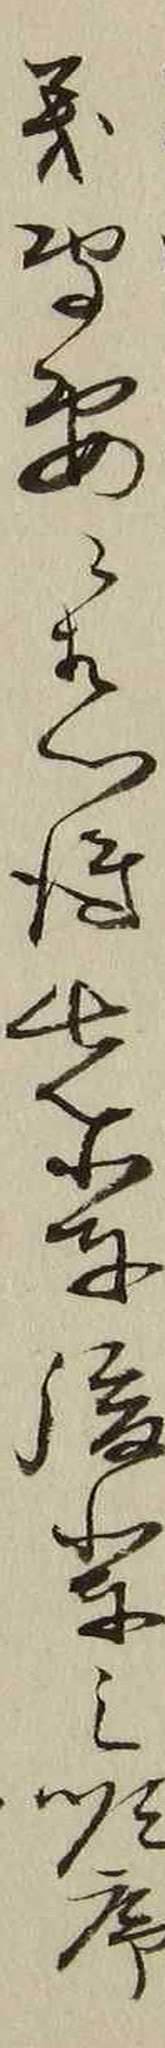義専安に相心得先輩後輩之順席
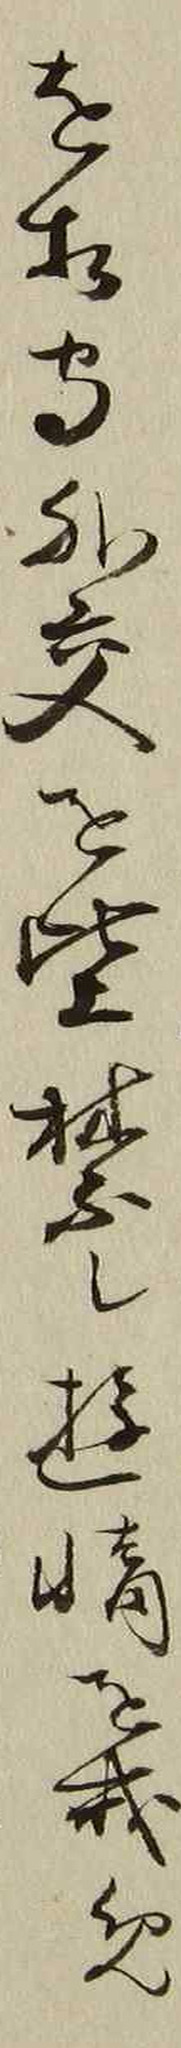を相守外交を皆禁し遊情戒め
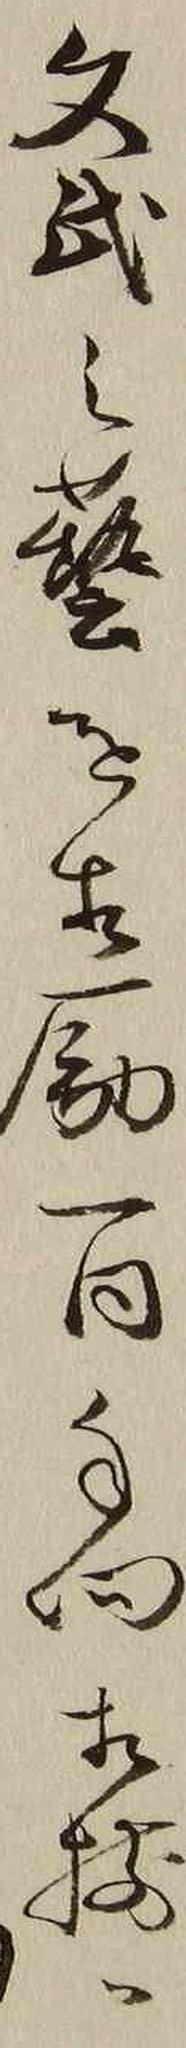文武之芸を相励一同手向相揃候
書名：諸士系譜　巻之292　き之部1
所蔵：会津若松市立会津図書館
